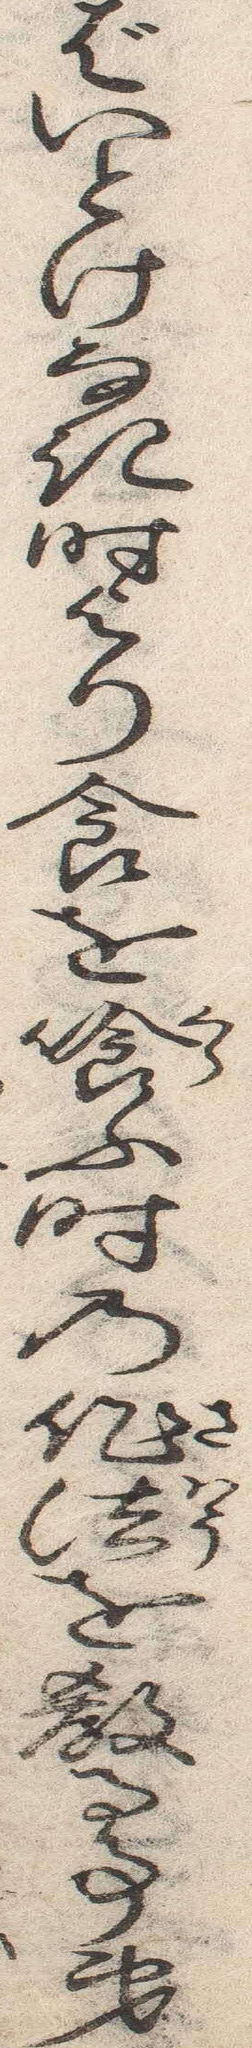ばいとけなき時より食を喰ふ時の作法を教る事第
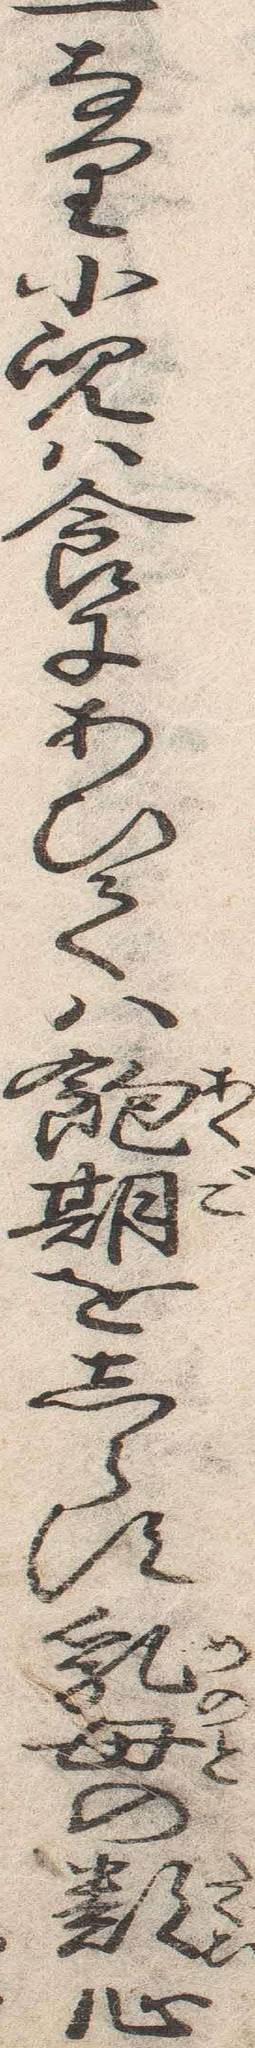一なり小児は食にあひては飽期をしらす乳母の類心
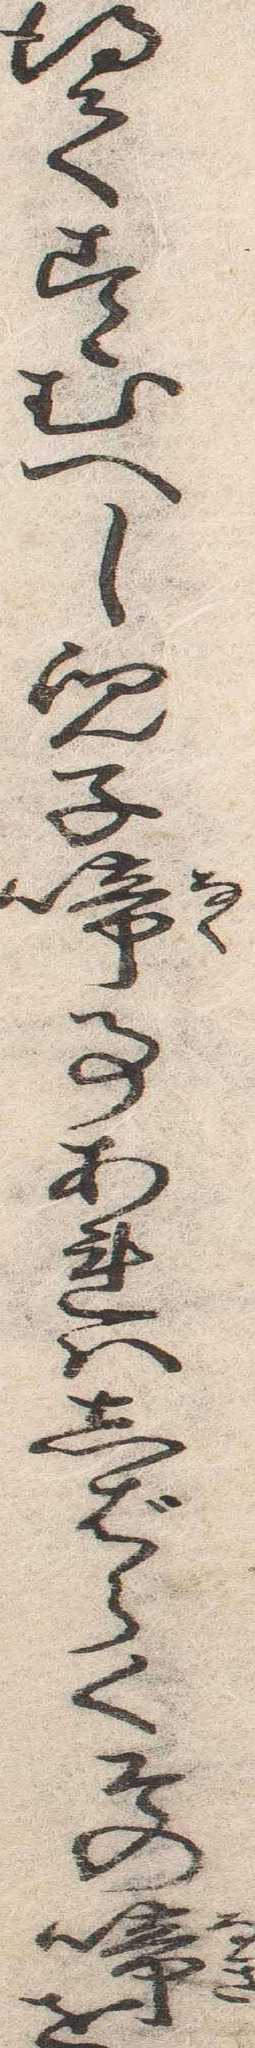得てすゝむへし児子啼事あれはしばらくその啼を
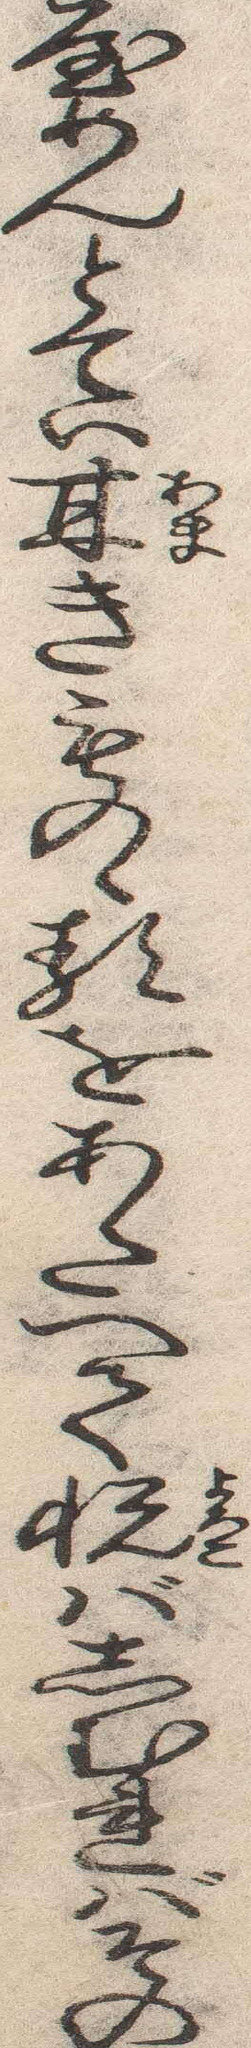やめんとては甘きものゝ類をあたへて悦ばしむればその
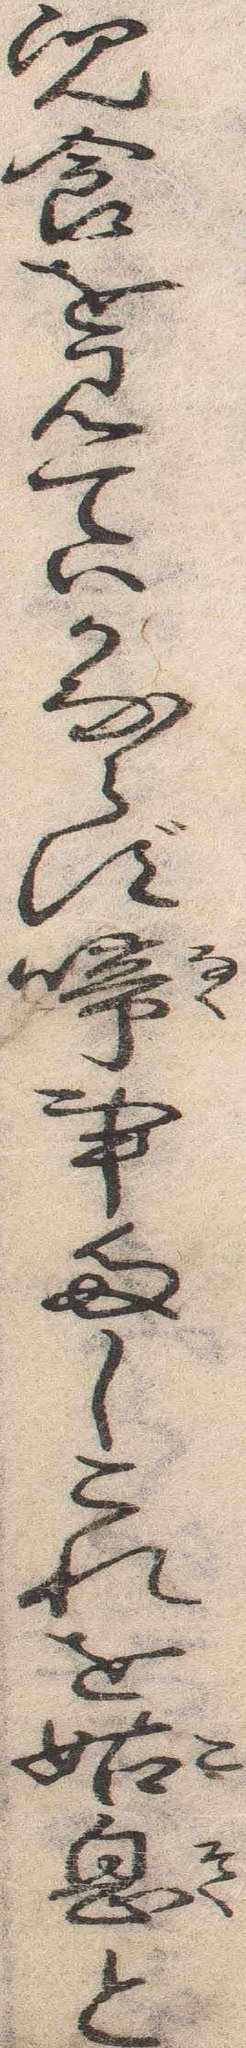児食を見てはかならず啼事多しこれを姑息と

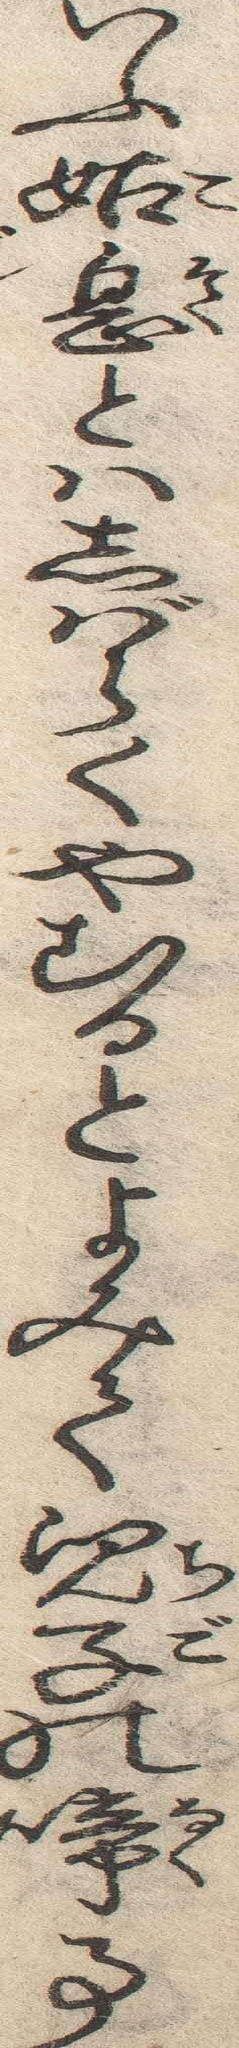いふ姑息とはしばらくやむるとよみて児子の啼事
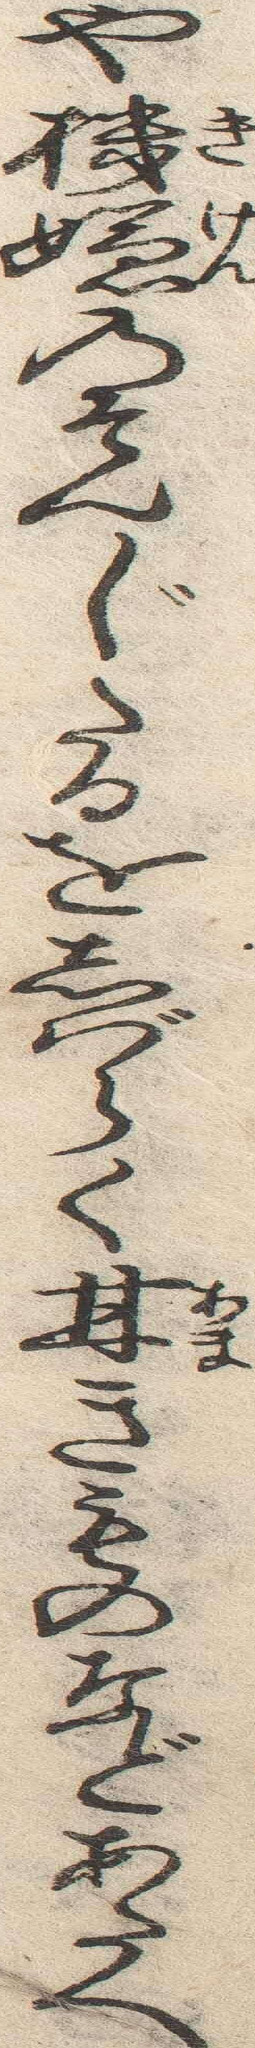や機嫌のそんじたるをしばらく甘きものなどあたへ
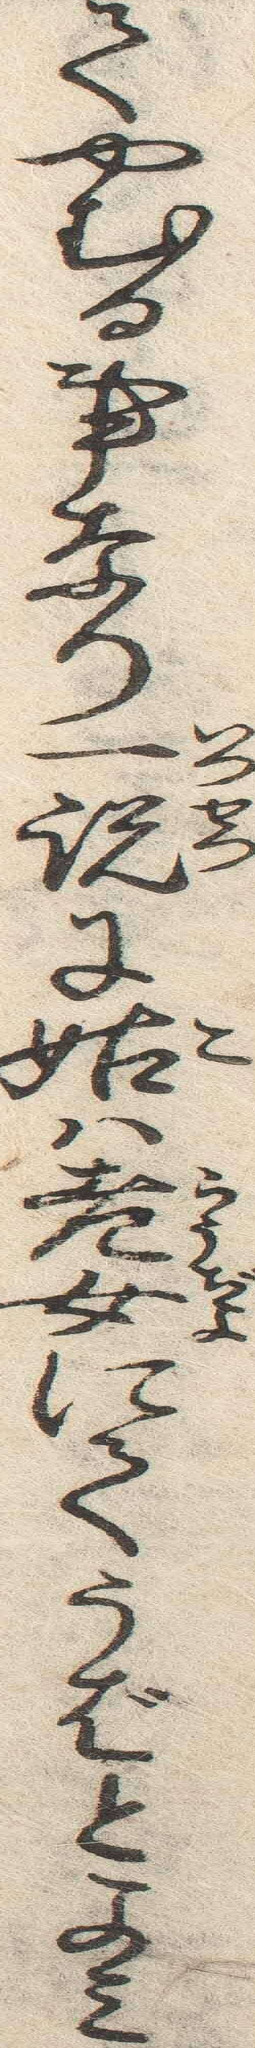てやむる事なり一説に姑は老女にてうばとよみ
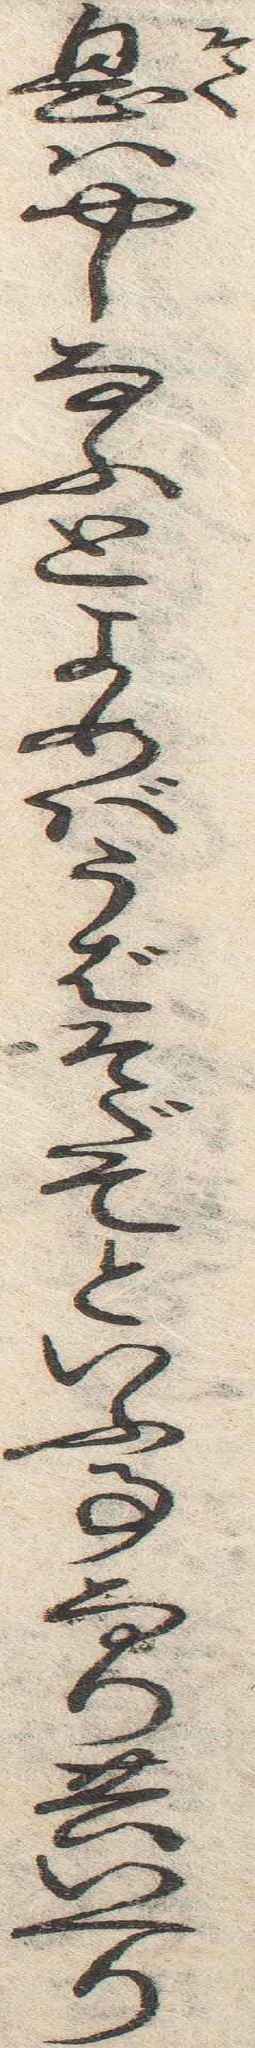息はやしなふとよめばうばそだてといふ事なり共いへり
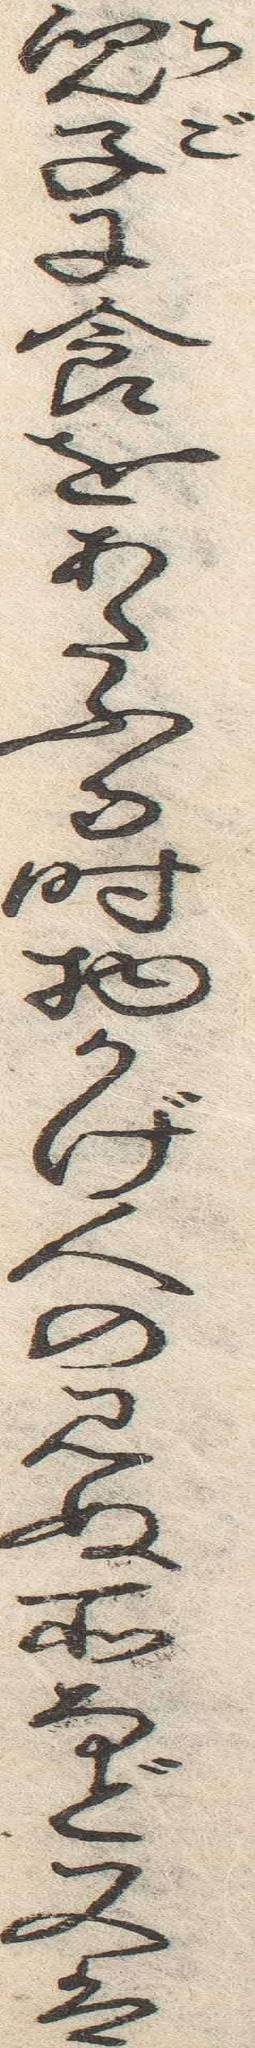児子に食をあたふる時物かげ人の見ぬ所など又は
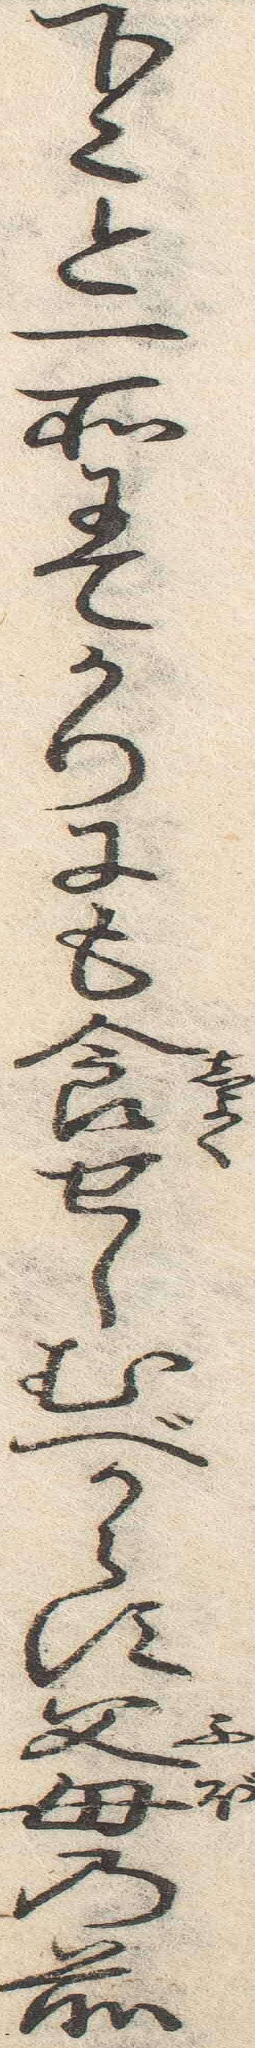下々と一所にてかりにも食せしむべからす父母の前
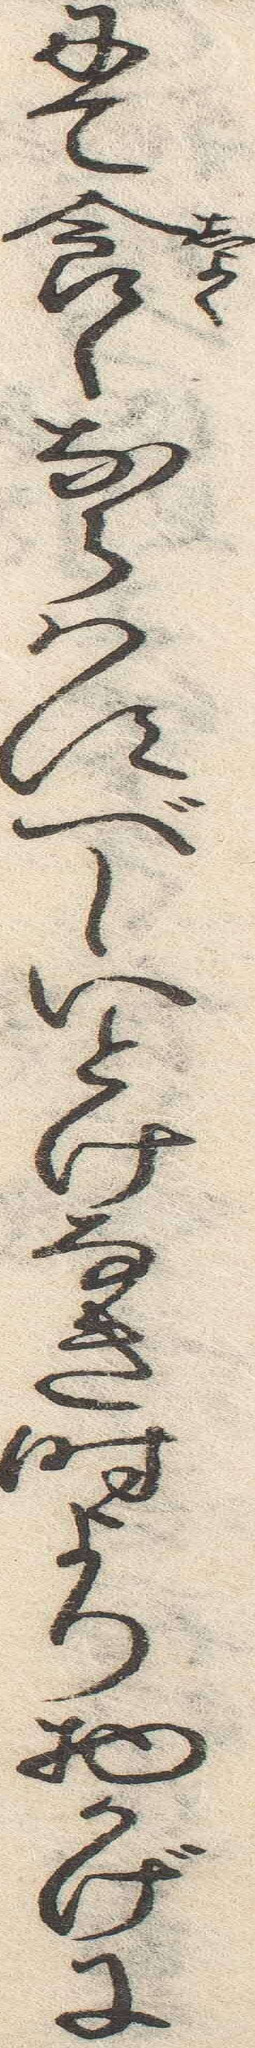にて食しならはすべしいとけなき時より物かげに
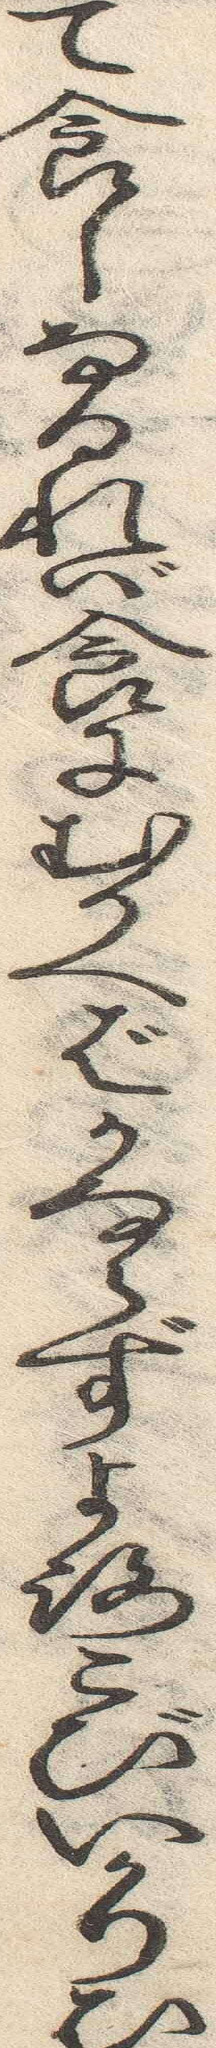て食しなるれば食にむかへばかならずよろこびいかりひ
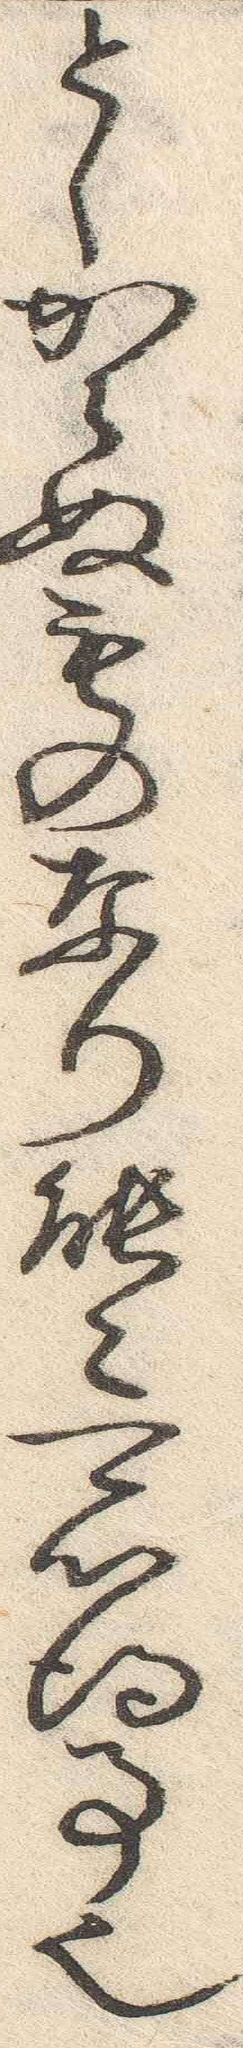としからぬものなり能々可心得事也
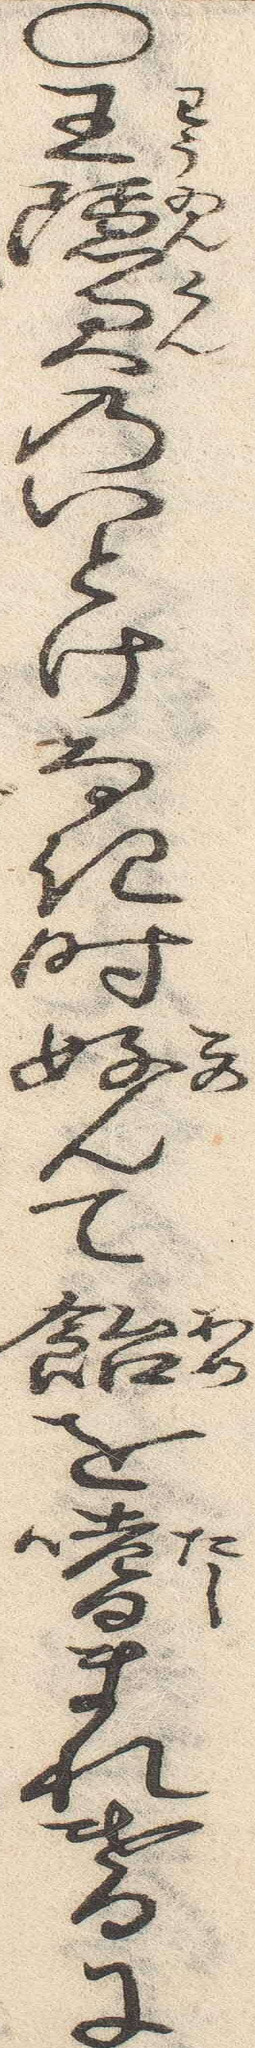○王隠君のいとけなき時好んて飴を嗜まれけるに
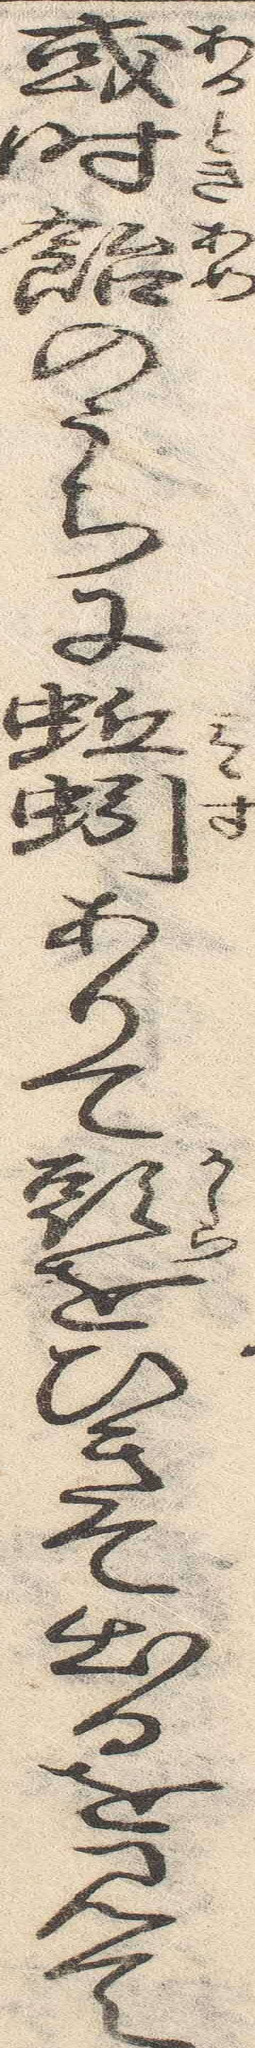或時飴のうちに蚯蚓ありて頭をひきて出るを見て
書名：小児必用養育草
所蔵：東京学芸大学附属図書館 国文学研究資料館
